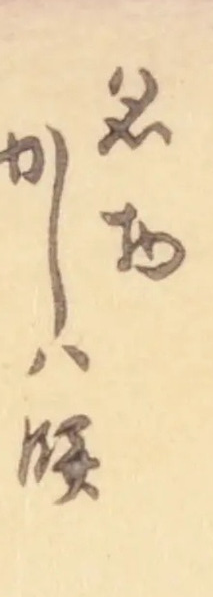かしは餅
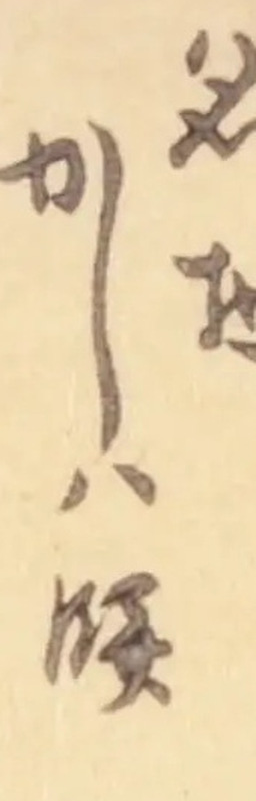かしは餅
